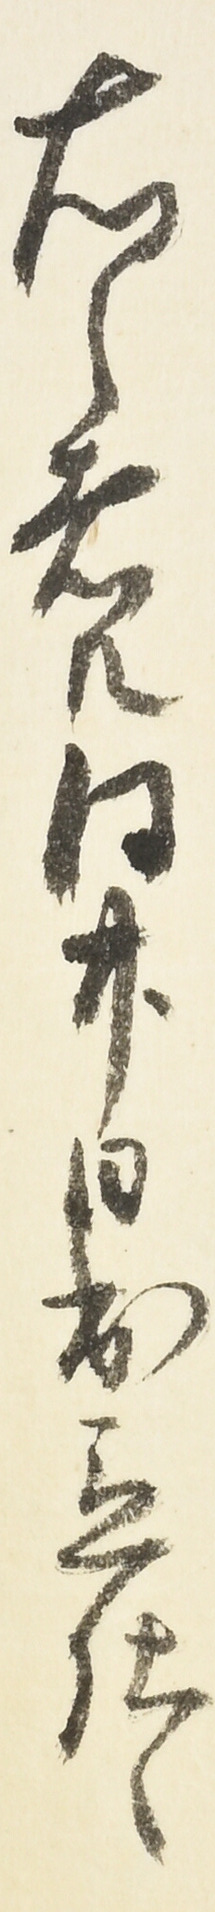右之者共同廿日出立仕候
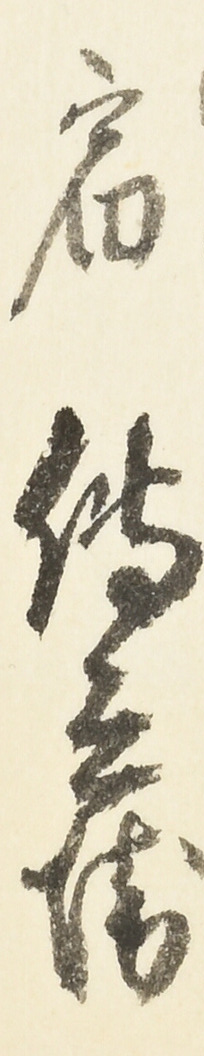宿伝兵衛
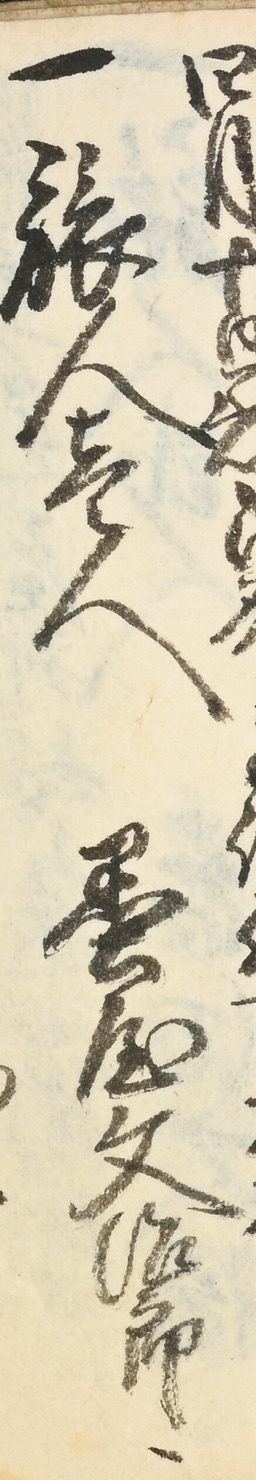一旅人壱人扇屋半四郎・
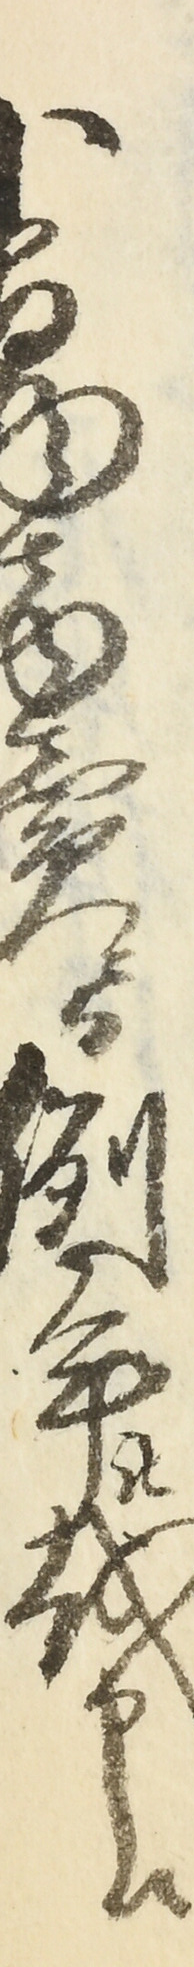薬種商売ニ而例年罷越申候

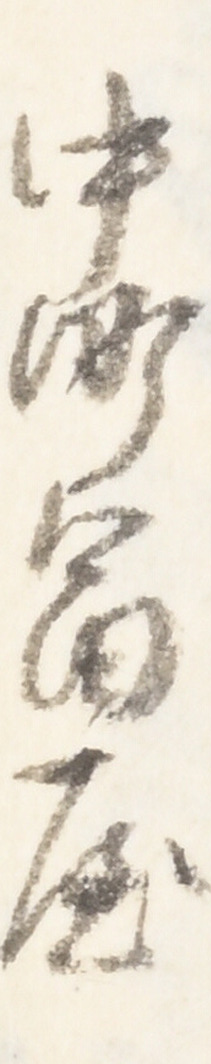中町冨屋
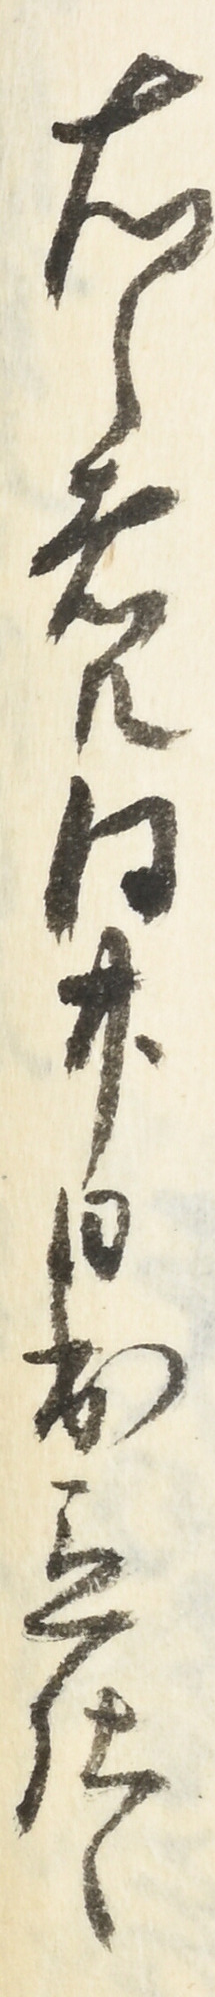右之者同廿五日出立仕候
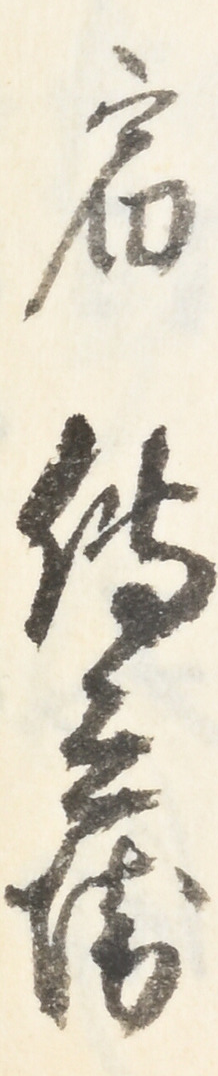宿伝兵衛
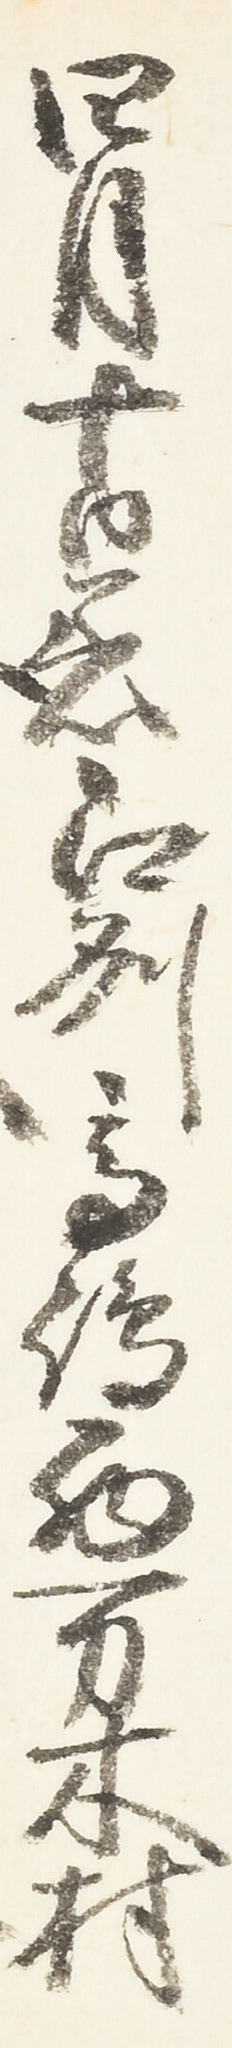四月十日着江州高嶋西万木村
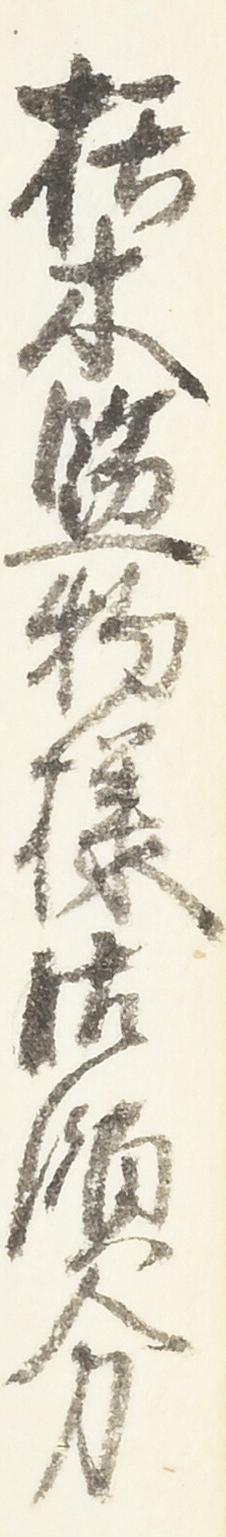朽木監物様御領分
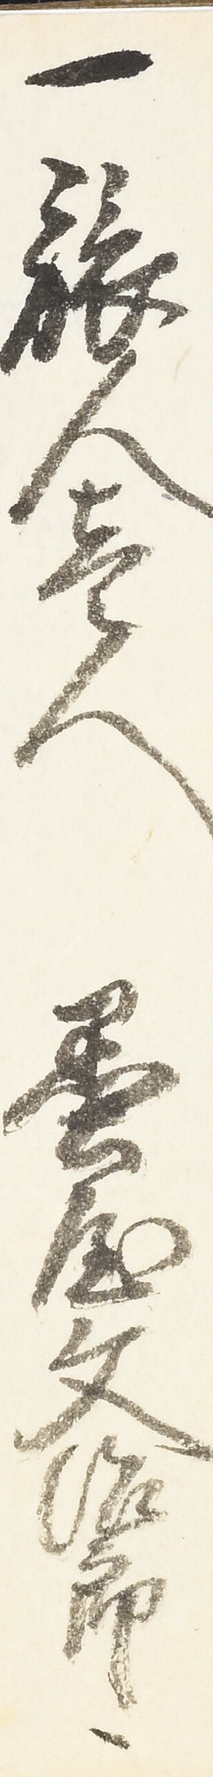一旅人壱人墨屋文治郎・
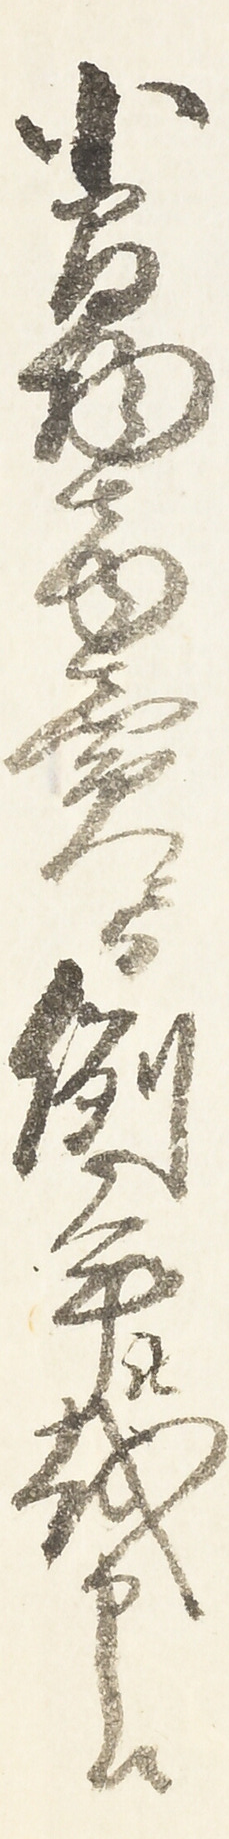小間物商売ニ而例年罷越申候
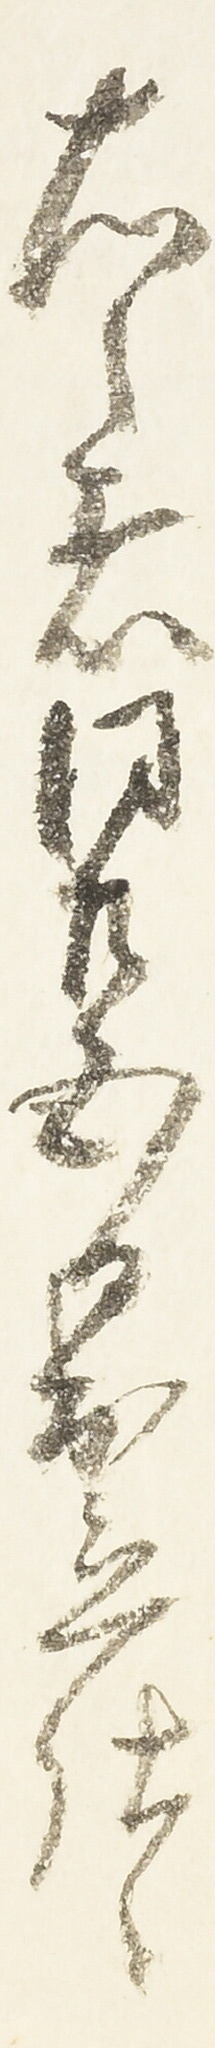右之者同廿五日出立仕候
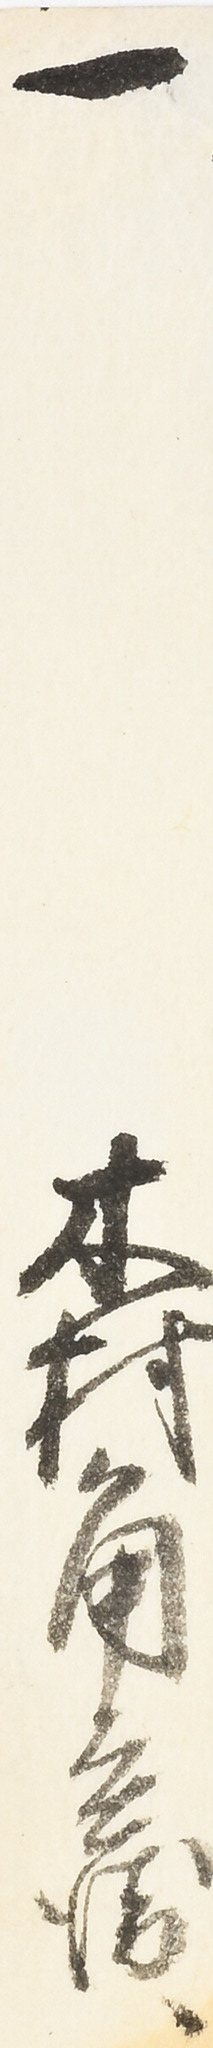一木村角兵衛・
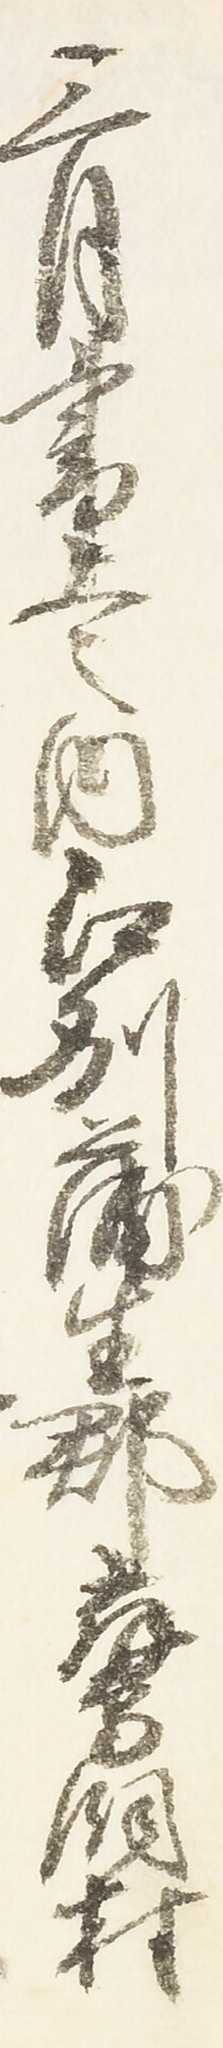三月書上之内江州蒲生郡鷹飼村
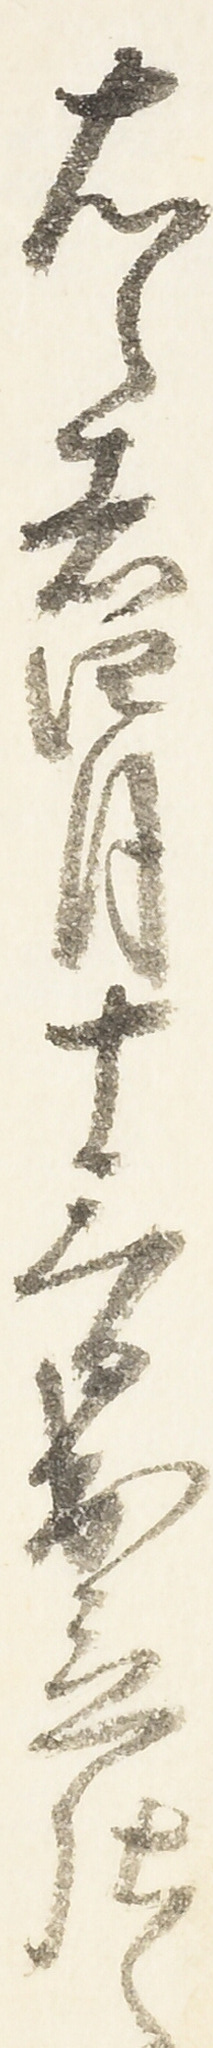右之者四月十三日出立仕候
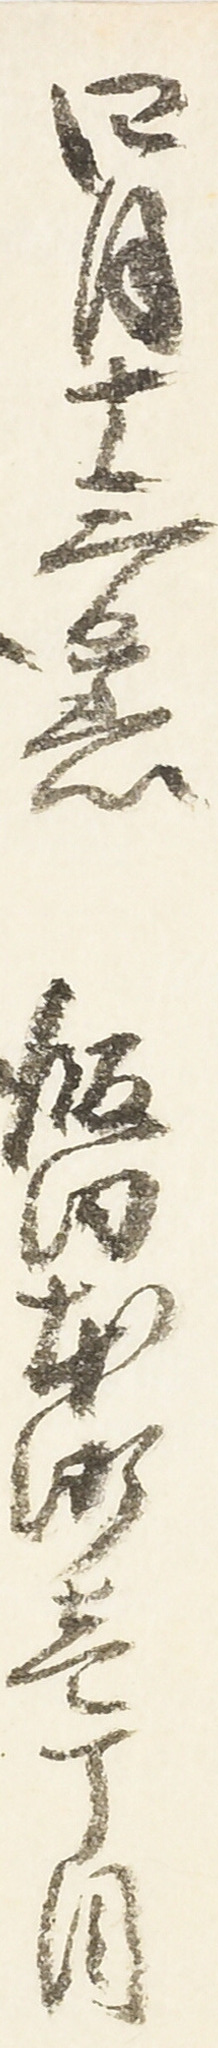四月十三日着飯田本町壱丁目
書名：町中旅人泊控帳
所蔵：伊那市立高遠町図書館・合同会社AMANE
